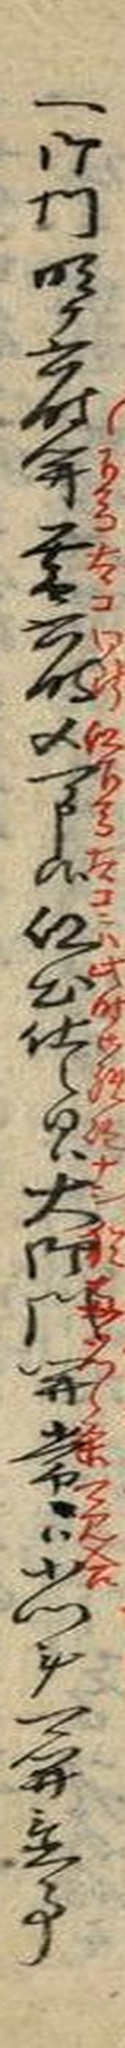一御門明六時開暮六時〆可申候但出仕之日は大御門開常には小門斗可開置候事
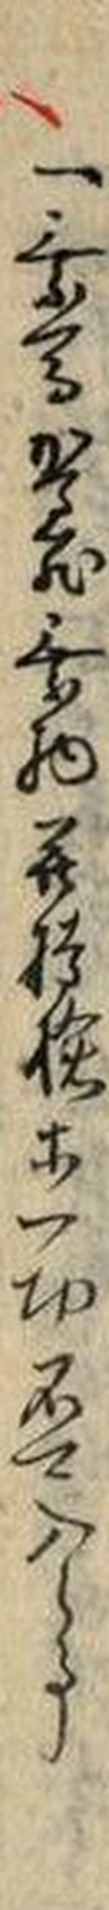一乗馬駕籠乗物并持鎗等一切不可入候事

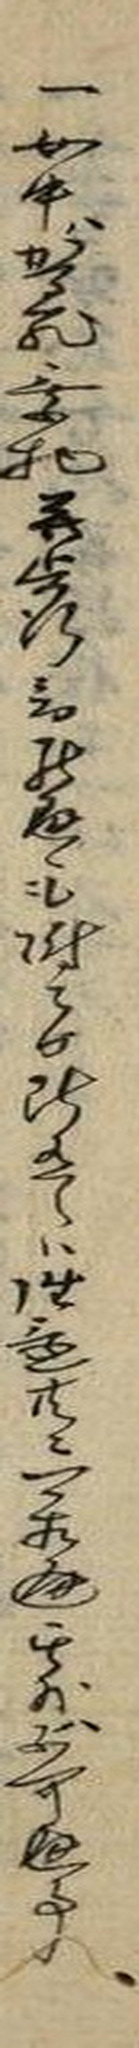一女中駕籠乗物并歩行に而罷通候も附々にゟ断有之候は往還共に可相通其外ハ不可通候事
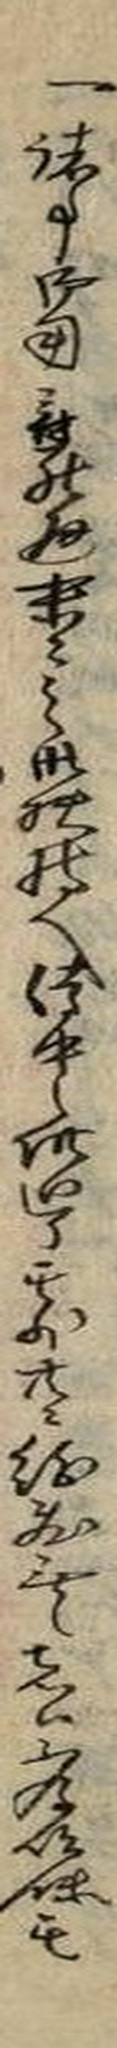一諸事御用に付罷通末々之御扶持人侍中供廻り其外共に紛敷無之者は不及吟味其
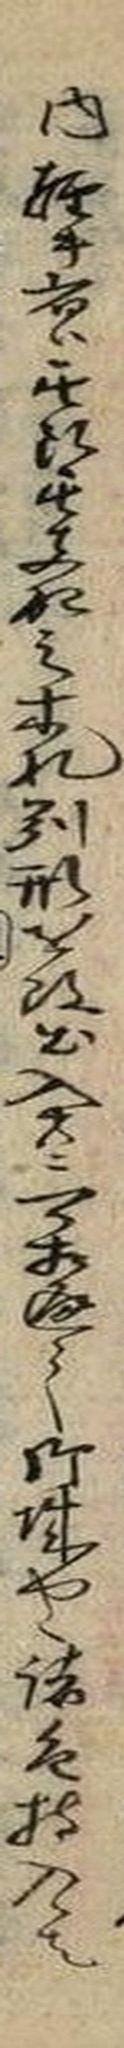内軽き者は其頭其支配之木札判形を改出入共に可相通之御城中へ諸色持入候は
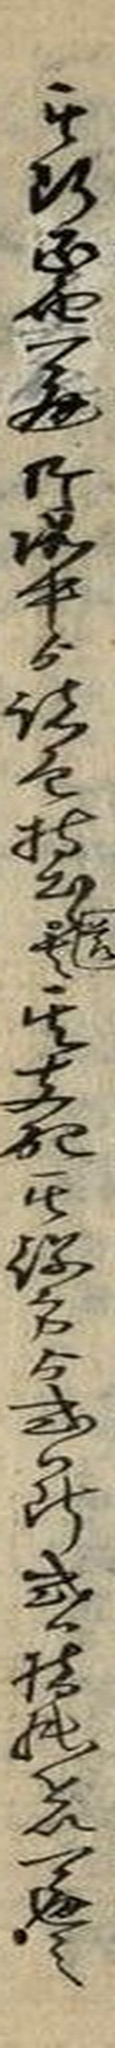其断承届一通御城中ゟ諸色持出候節は其支配其役方ゟ或は断或は指紙を以可通之
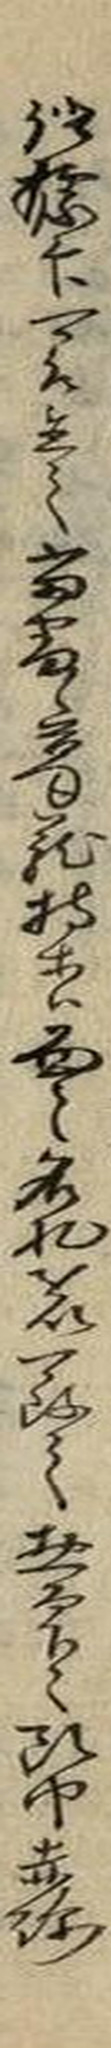証拠印可取置之当番之葛籠持等は面々名札を以可改之惣而下々頭巾赤綿
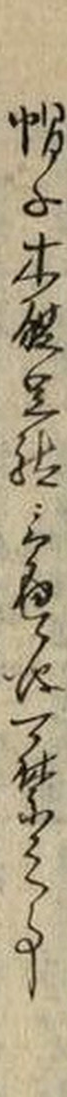帽子木履足駄に而通候儀可禁之候事
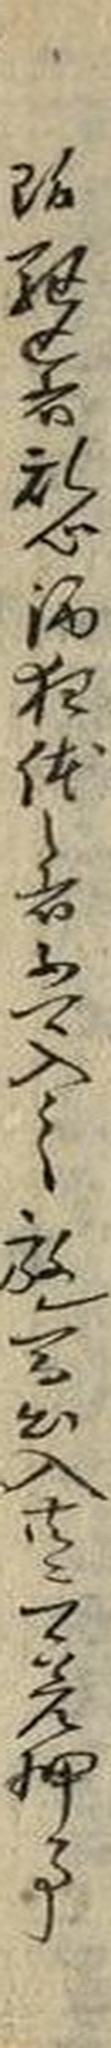附駆込者乱心酒狂体之者不可入之放れ馬出入共に差押事
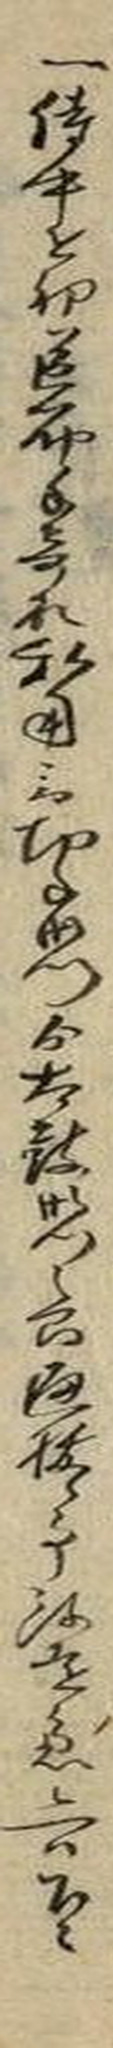一侍中を初道筋手寄故私用に而切手御門ゟ太鼓御門之間通抜候事致遠慮候へは下々
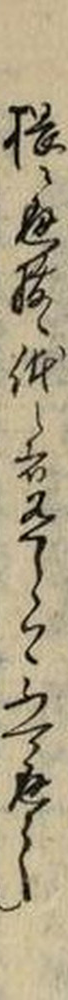猥に通抜之体候者有之候はゝ不可通之
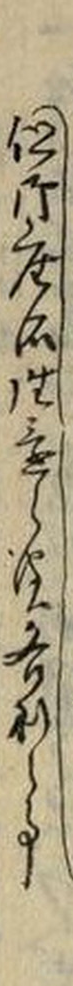但御座所往還之儀は各別之事
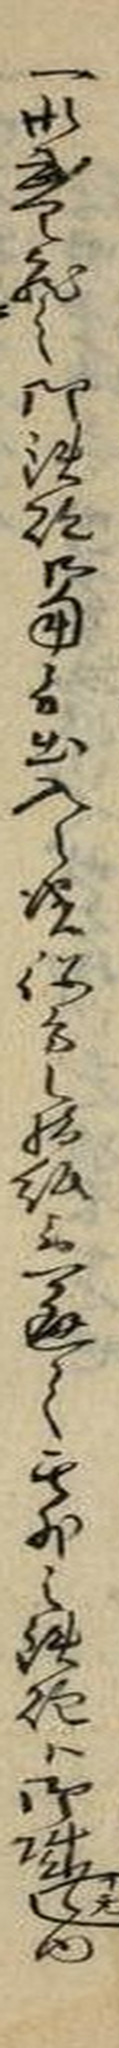一御武具蔵之御鉄砲御用に付出入之儀役方之指紙に而可通之其外之鉄砲は御城之内
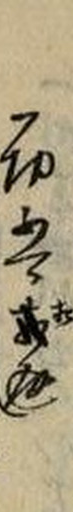一切不可相通
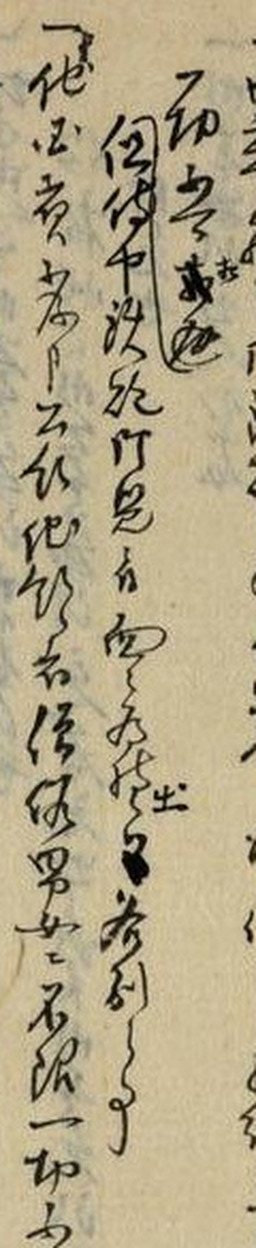但侍中鉄砲御覧に付面々為持出候は各別之事
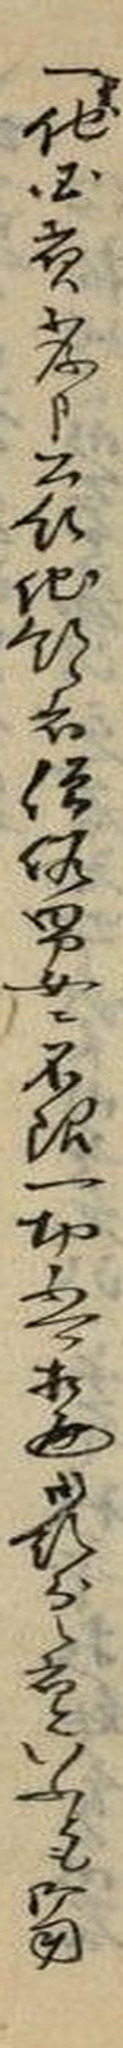一他国者は不及申公領他領之者僧俗男女に不限一切不可相通御領分之者といふとも御用
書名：御門御櫓之部
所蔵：福井県文書館 Fukui Prefectural Archives
